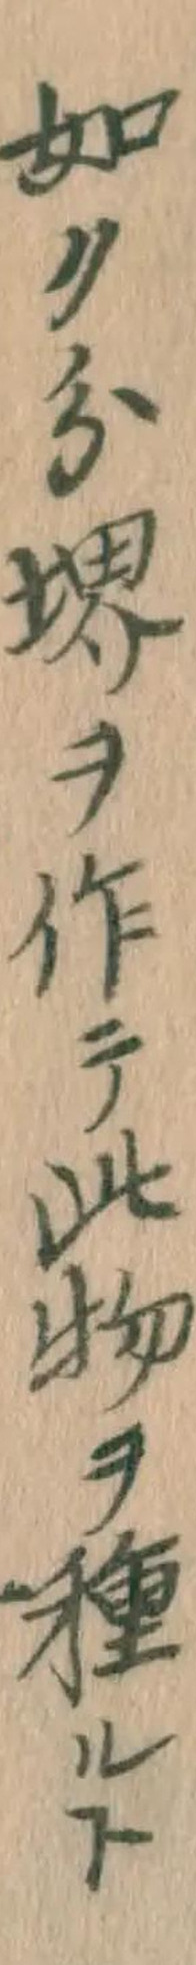如ク分堺ヲ作テ此物ヲ種ルト
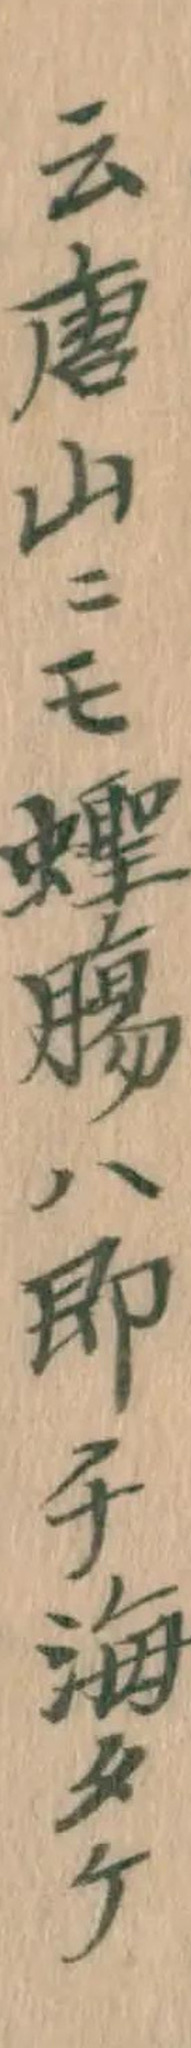云唐山ニモ蟶膓ハ即チ海タケ
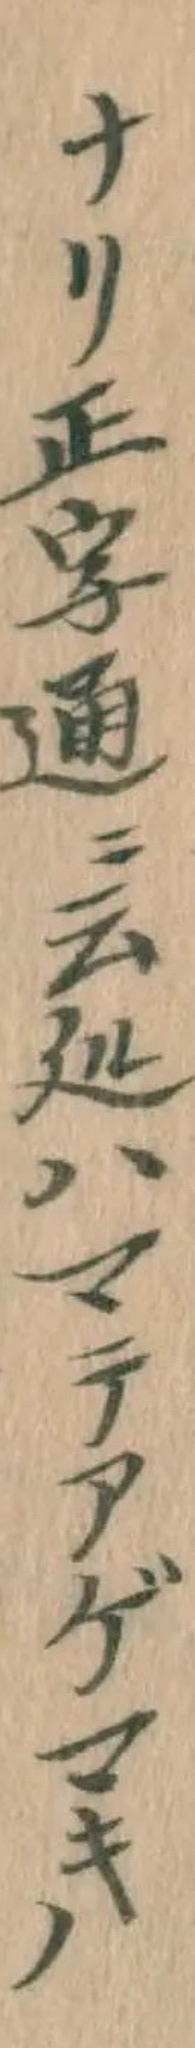ナリ正字通ニ云処ハマテアゲマキノ
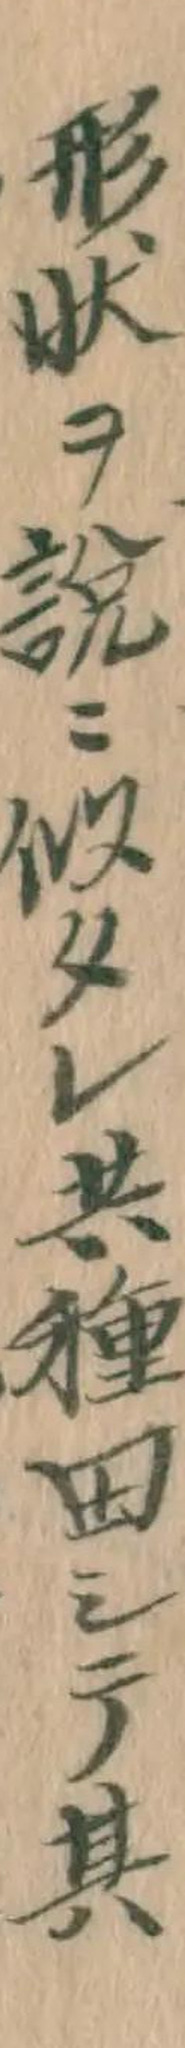形状ヲ説ニ似タレ共種田シテ其
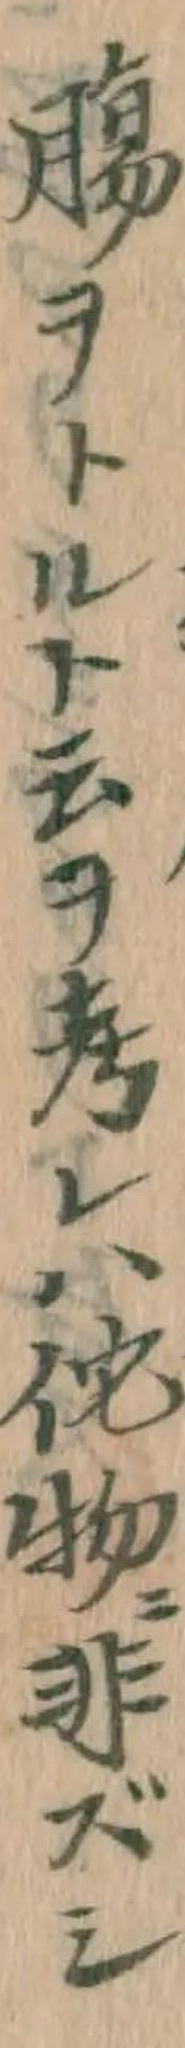膓ヲトルヲ云ヲ考レハ佗物ニ非ズシ
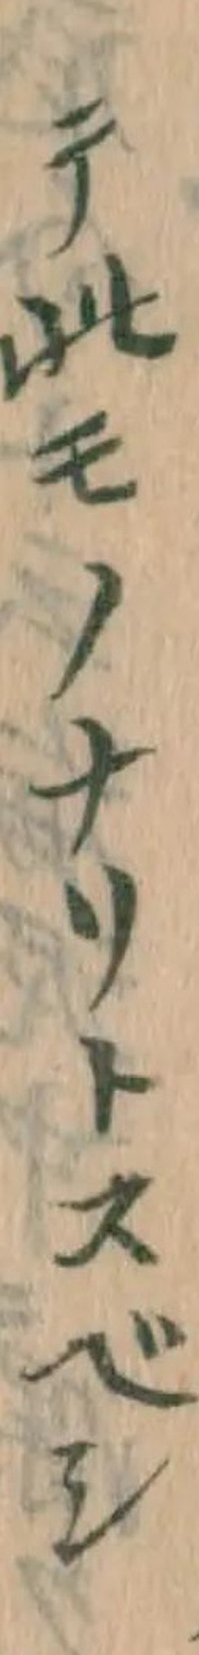テ此モノナリトスベシ

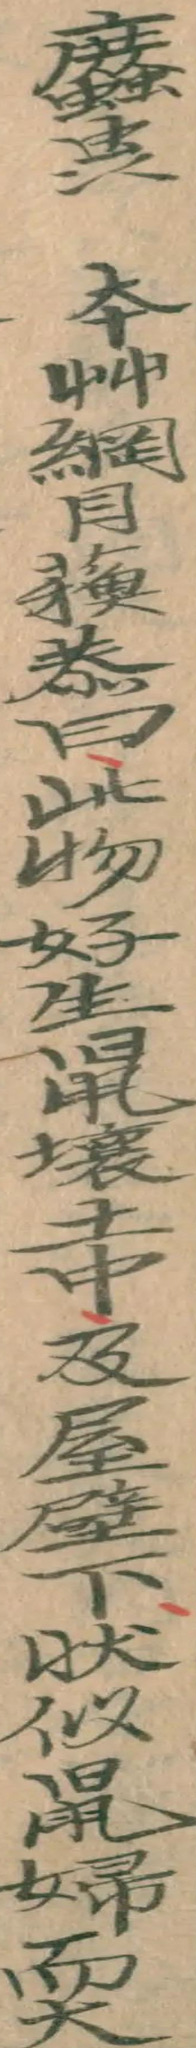蟲本艸綱目蘇恭曰、此物好生鼠壌土中、及屋壁下、状似鼠婦而大
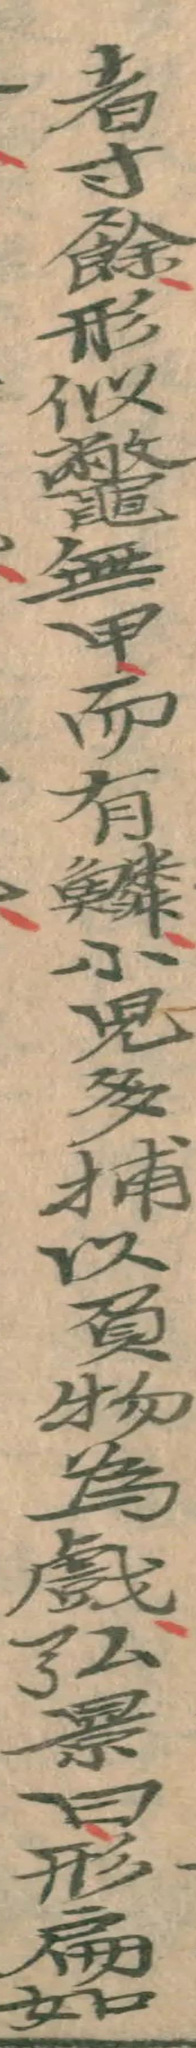者寸餘、形似鼈無甲、而有鱗、小児多捕以負物為戯，弘景曰、形扁如
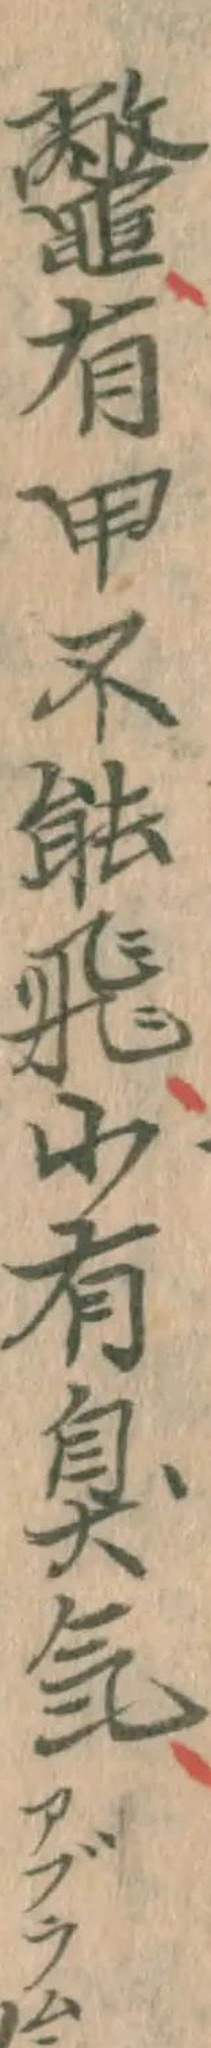鼈、有甲不能飛、少有臭気、
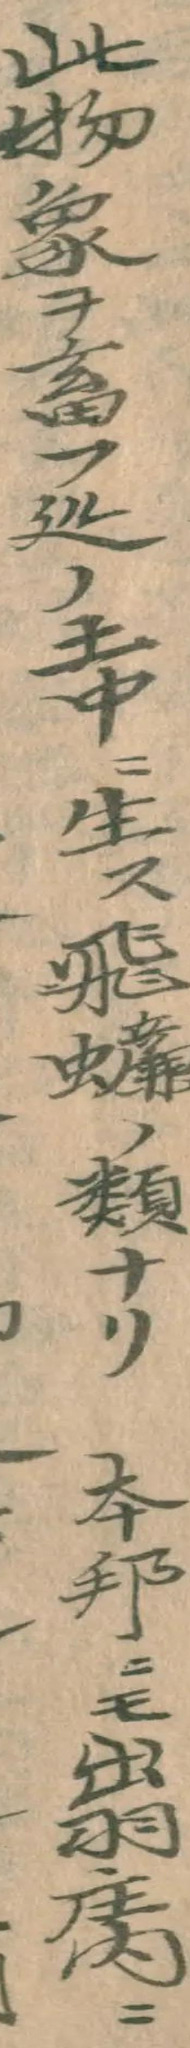此物象ヲ畜フ処ノ土中ニ生ス飛蠊ノ類ナリ本邦ニモ出羽庄内ニ
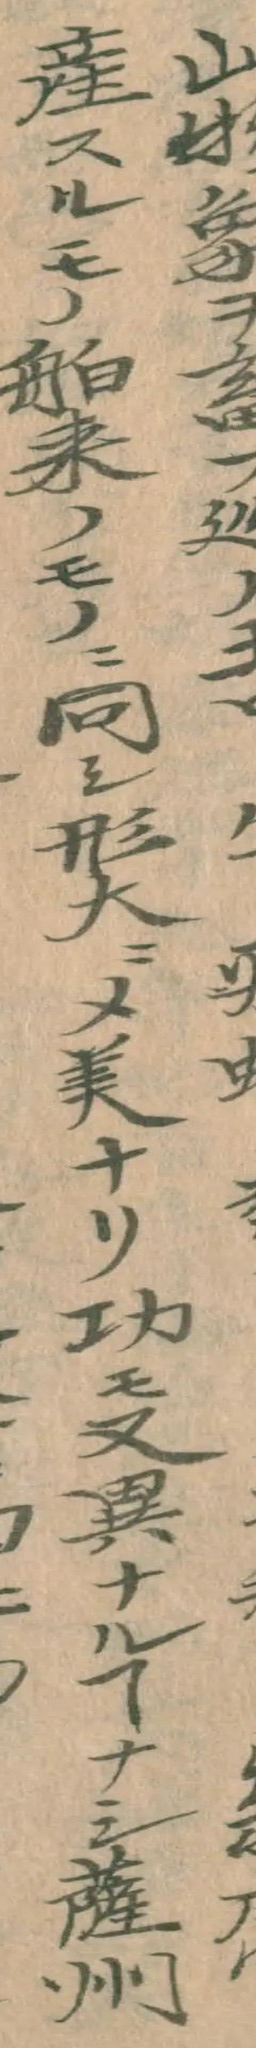産スルモノ舶来ノモノニ同シ形大ニシテ美ナリ功モ又異ナルコトナシ薩州
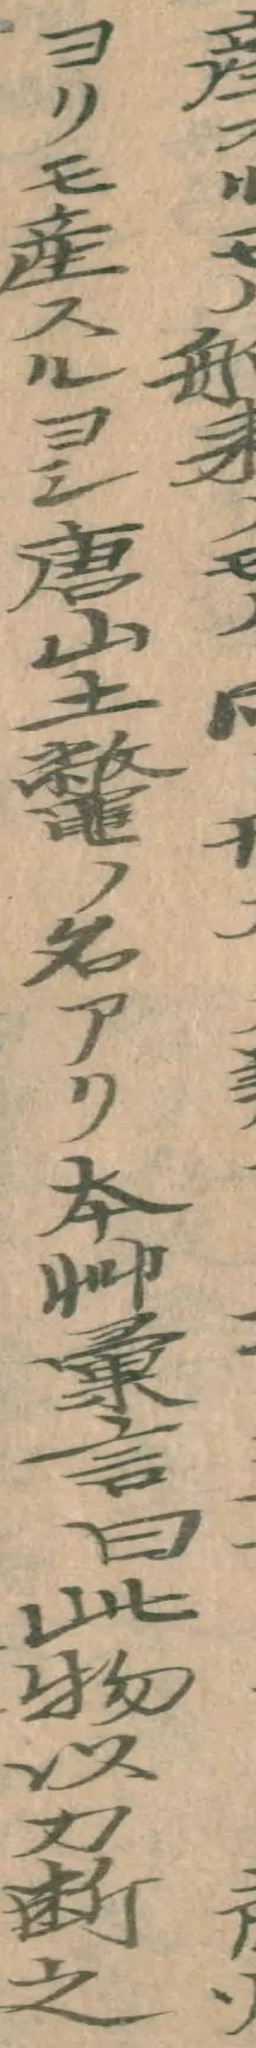ヨリモ産スルヨシ唐山土鼈ノ名アリ本艸彙言曰此物以刀断之
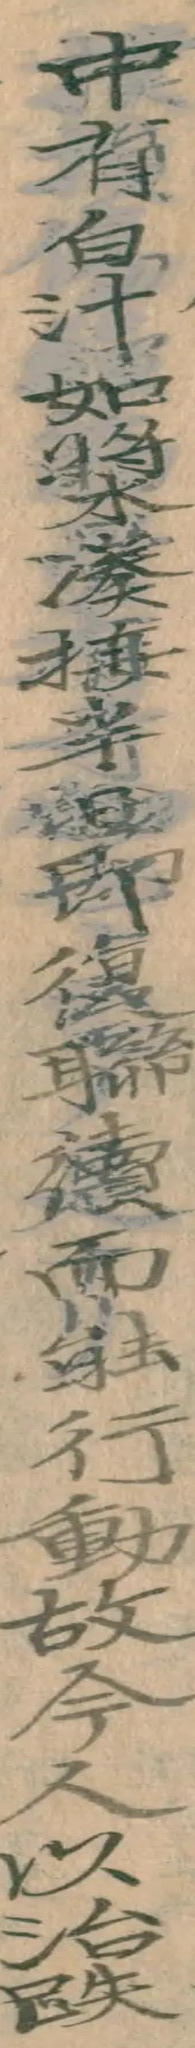中有白汁如漿湊接半日即復聨續而能行動故今人以治跌
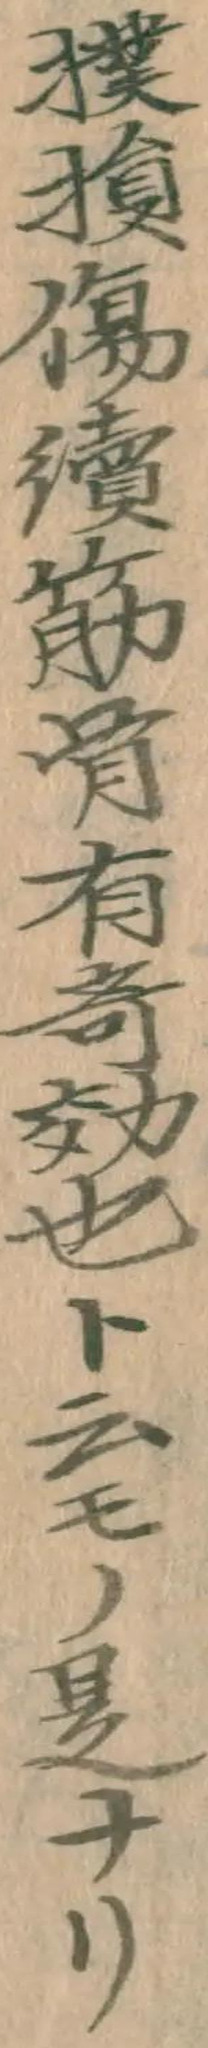撲損傷續筋骨有奇功也ト云モノ是ナリ
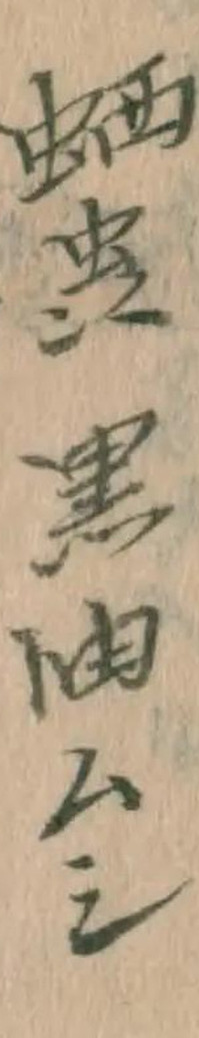𬠂蟲黒油ムシ
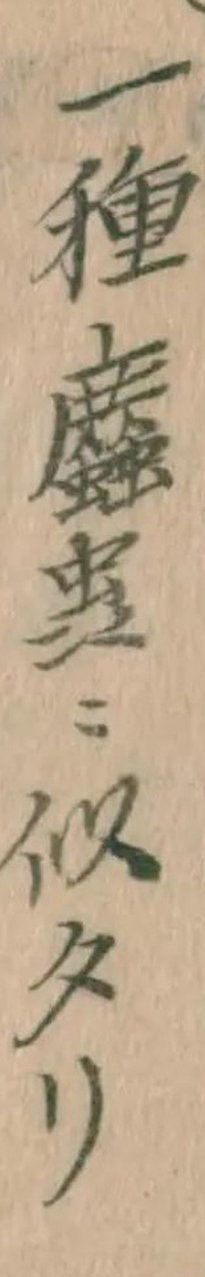一種蟲ニ似タリ
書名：千蟲譜 3巻. [1]
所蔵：国立国会図書館 National Diet Library, JAPAN
